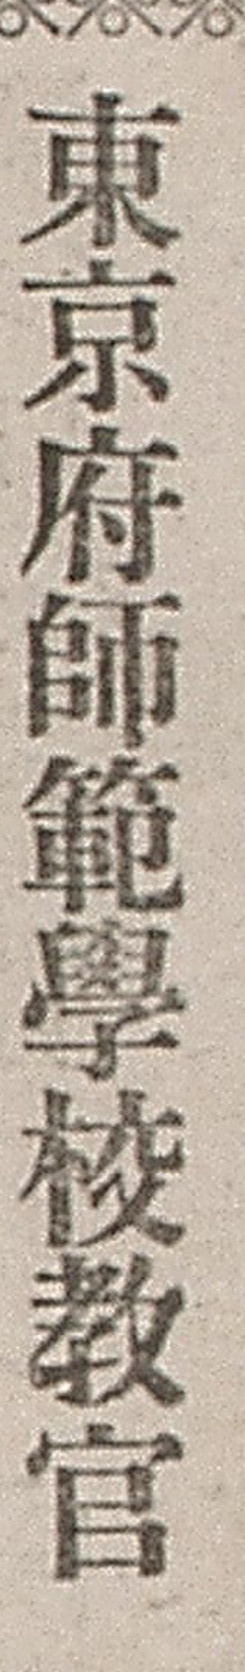東京府師範学校教官
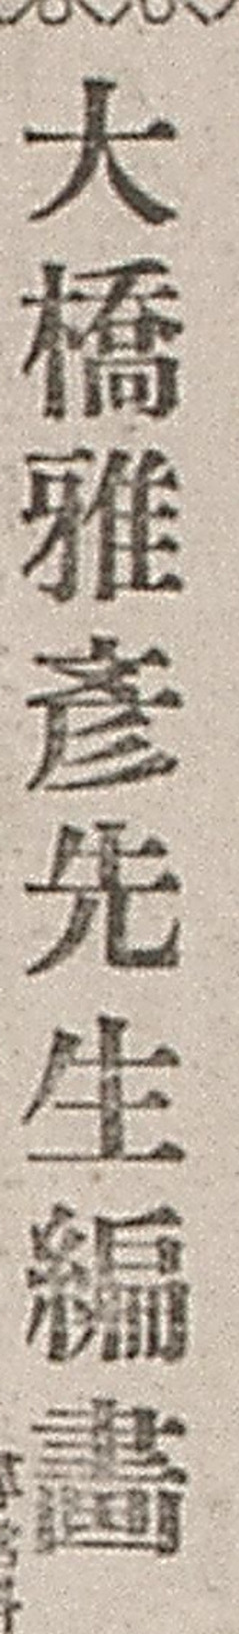大橋雅彦先生編畫
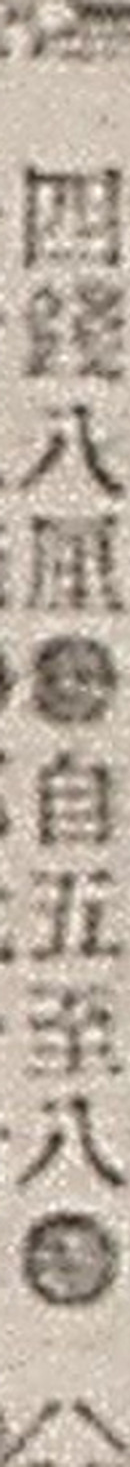四銭八厘●自五至八●
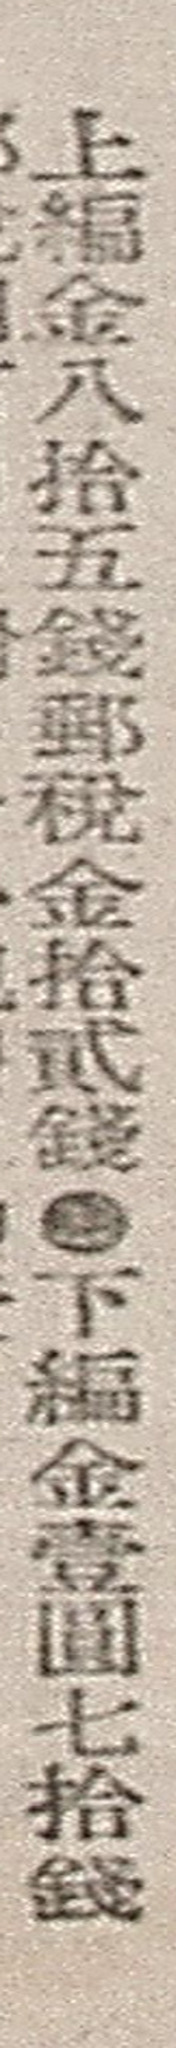上編金八拾五銭郵税金拾弐銭●下編金壱圓七拾銭
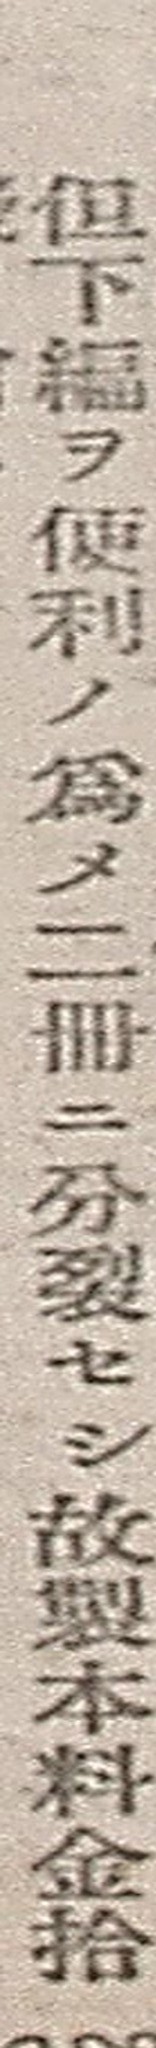但下編ヲ便利ノ為メ二冊二分裂セシ故製本料金拾
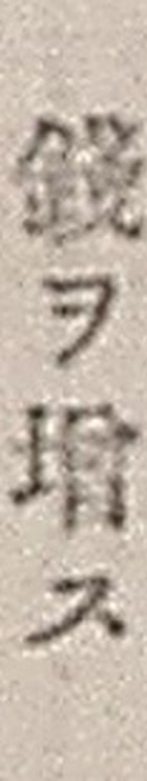銭ヲ増ス
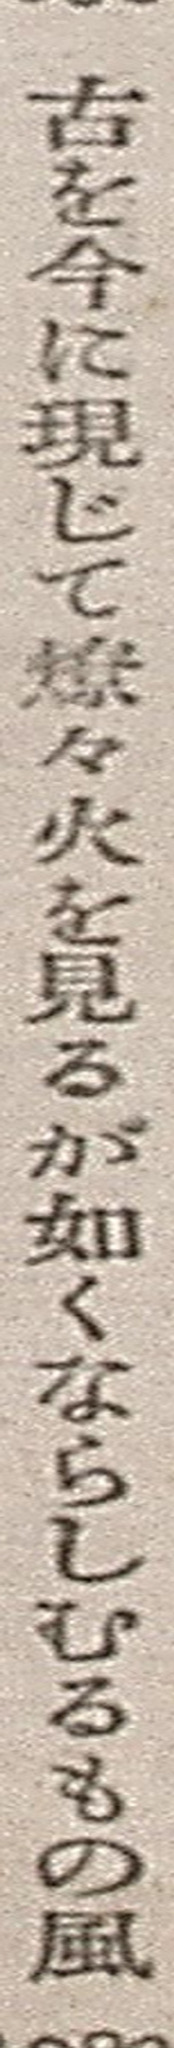右を今に現じて燎々火を見るが如くならしむるもの風
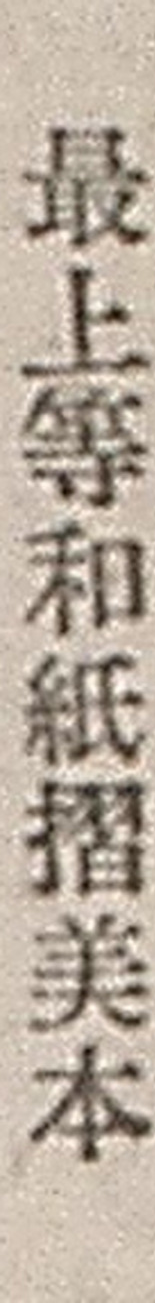最上等和紙摺美本
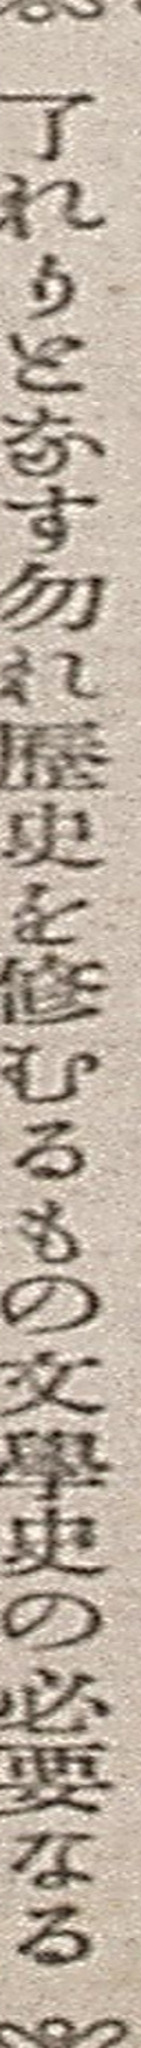了れりとなそ勿れ歴史を修むるもの文学史の必要なる
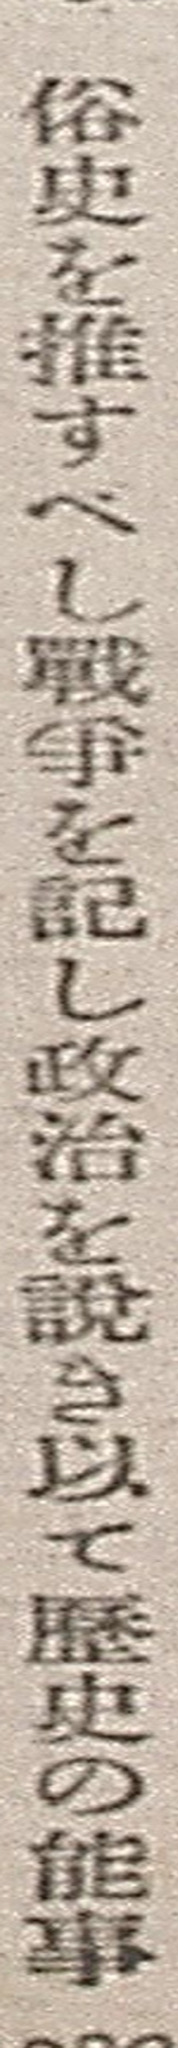俗史を推すべし戦争を記し政治を説き以て歴史の能事
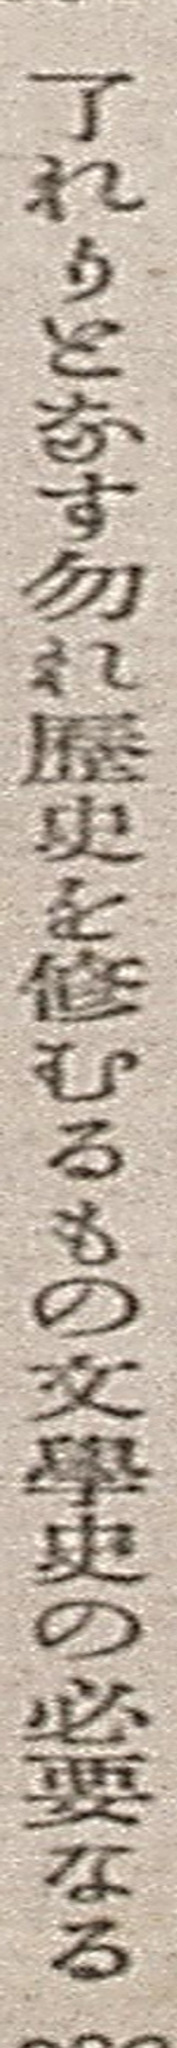了れりとなそ勿れ歴史を修むるもの文学史の必要なる
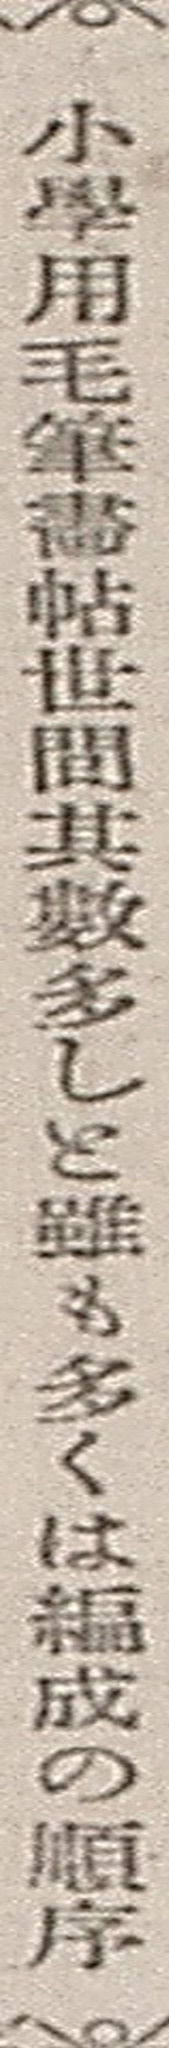小学用毛筆畫帖世間其数多しい雖も多くは編成の順序
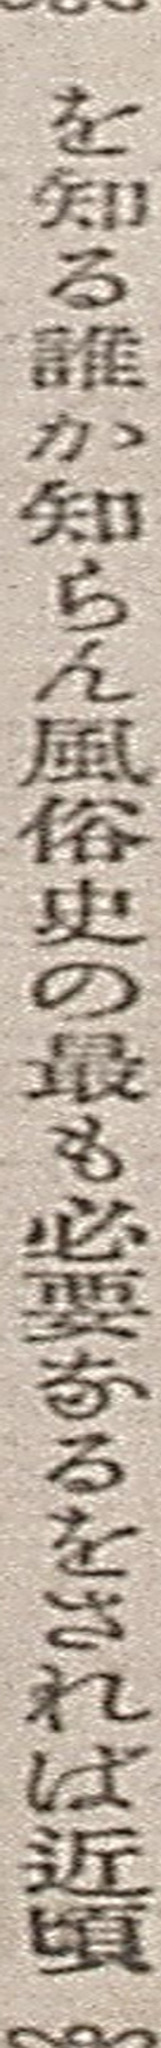を知る誰か知らん風俗史の最も必要なるをされば近頃
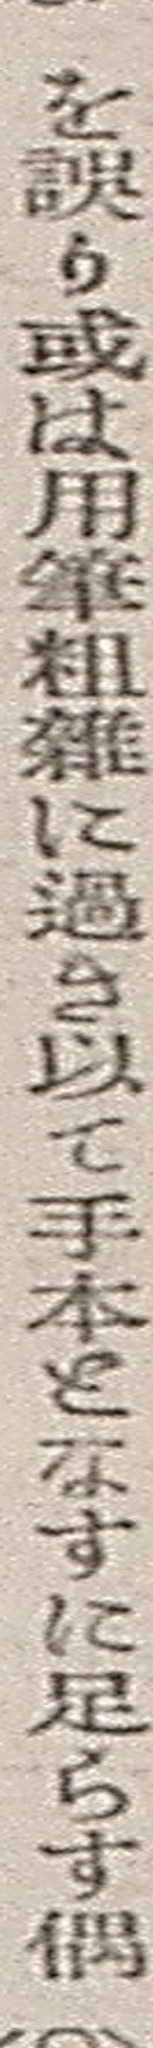を誤り或は用筆粗雑に過き以て手本となすに足らす偶
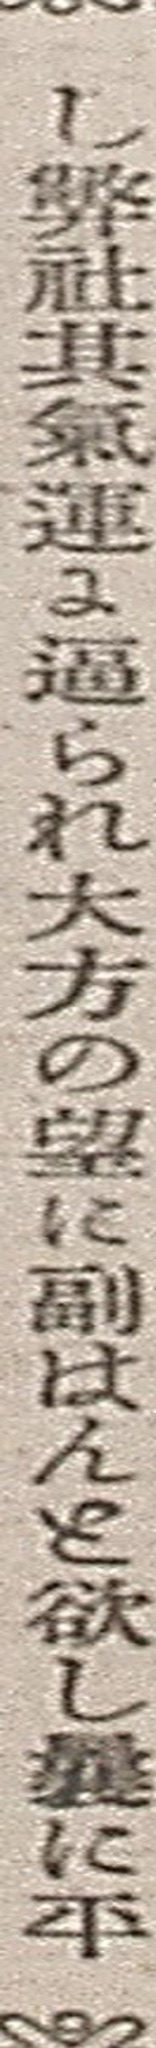し弊社其気運に逼られ大方の望に副はんと欲し曩に平
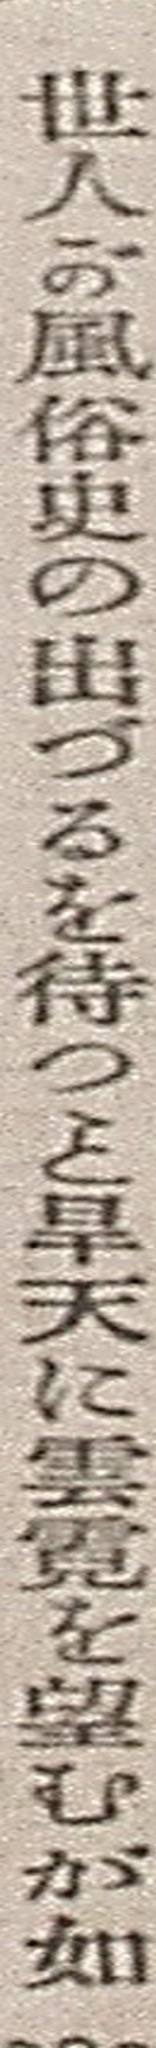世人が風俗史の出づるを待つこと旱天に雲霓を望むが如
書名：風俗畫報臨時増刊第百二十八號　洪水被害録（下）
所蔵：東京大学地震研究所図書室 Earthquake Research Institute Library, The University of Tokyo, JAPAN
